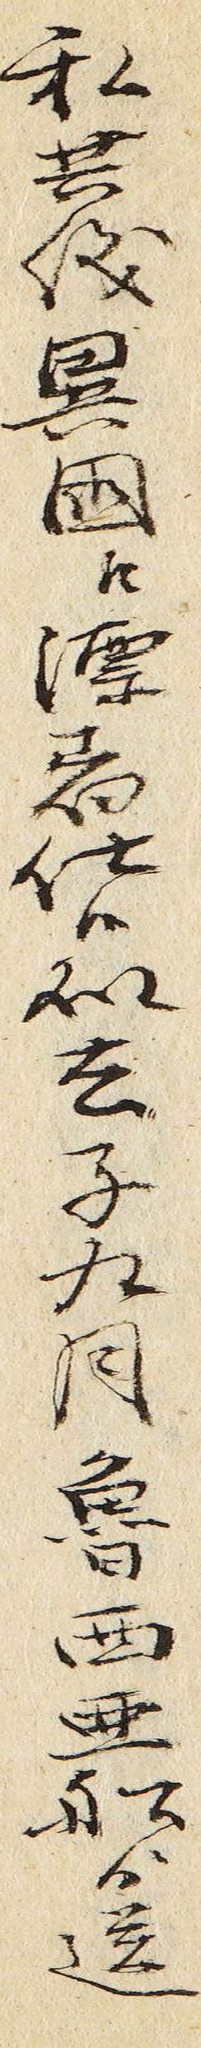私共儀異国え漂着仕候処去子九月魯西亜船ゟ送
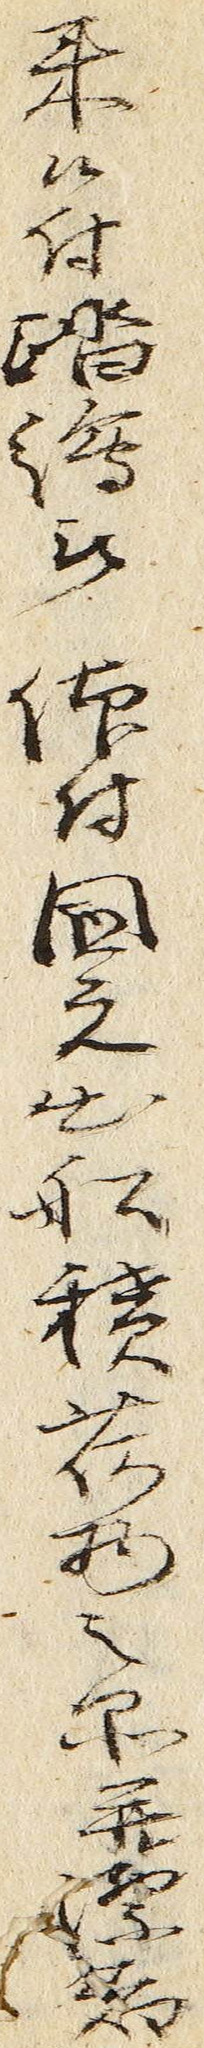来候付踏絵被仰付国元出船積荷物之品并漂着
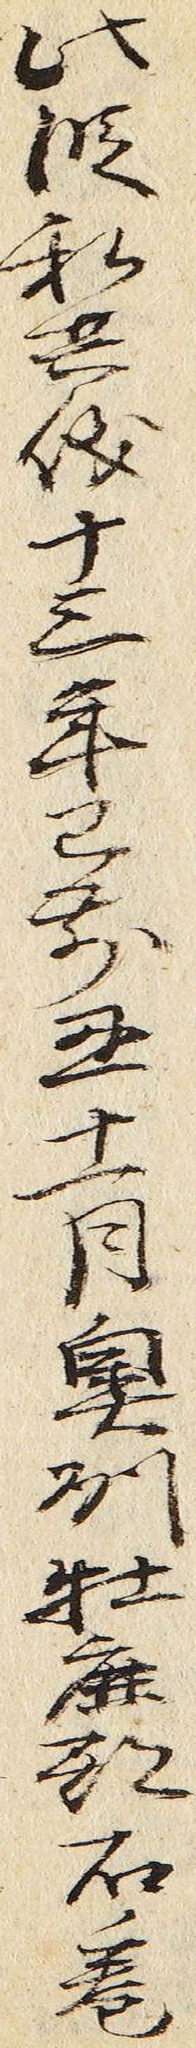此段私共儀十三年已前丑十一月奥州牡鹿郡石ノ巻
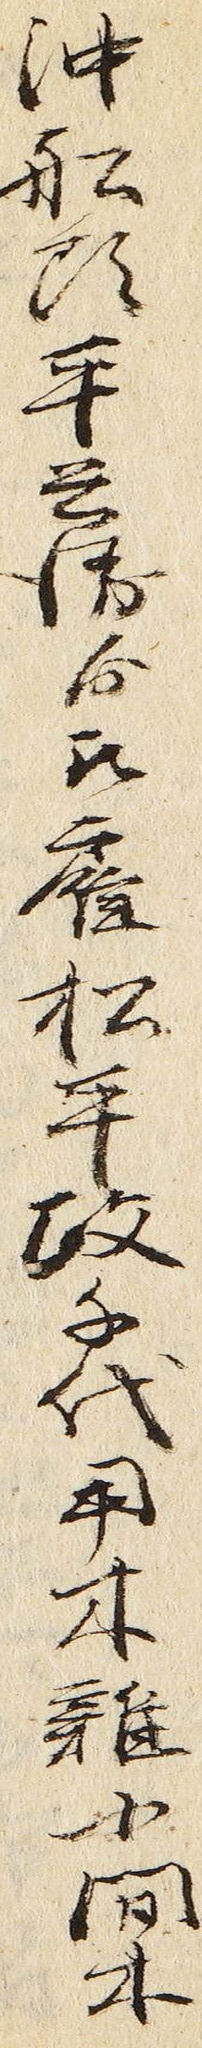沖船頭平兵衛ゟ被雇松平政千代用木雑小間木
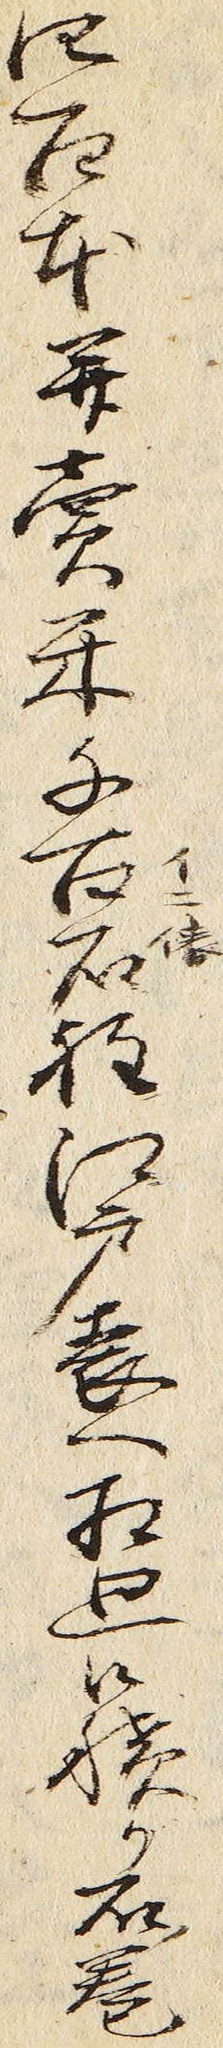四百本并売米千百石程江戸表へ相廻候積り石巻
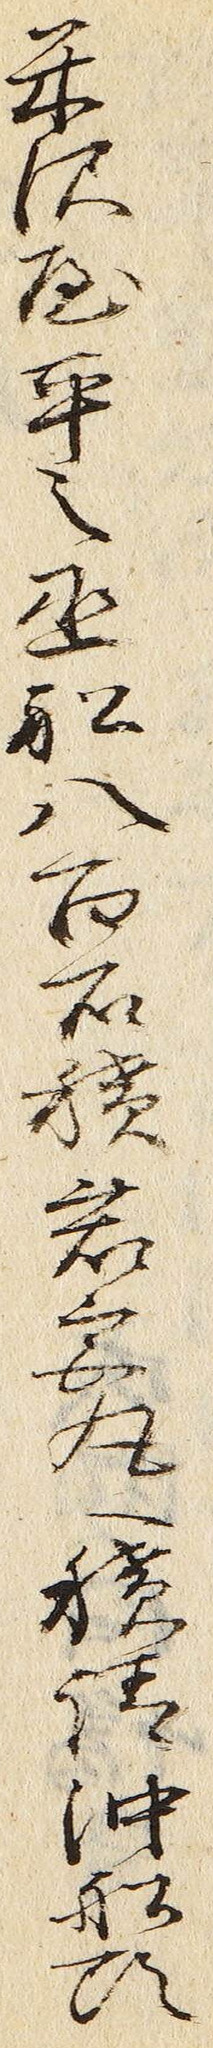米沢屋平之丞船八百石積若宮丸へ積請沖船頭
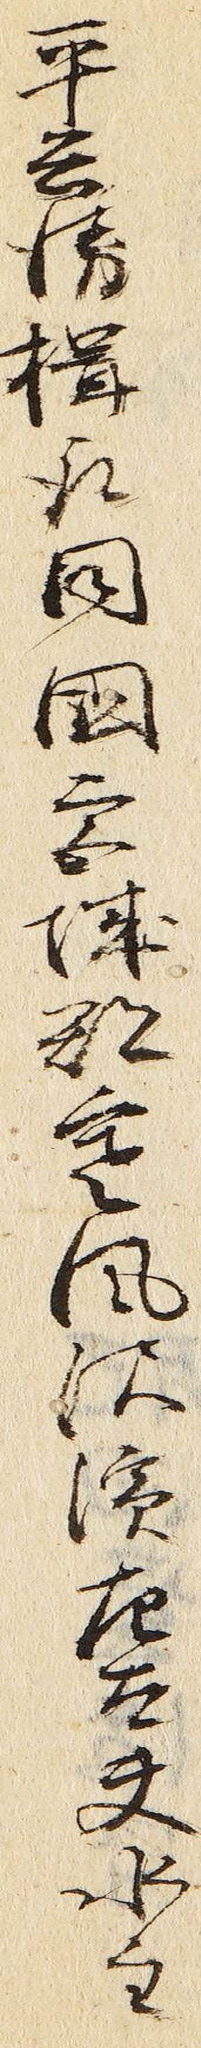平兵衛楫取同国宮城郡寒風沢浜左太夫水主
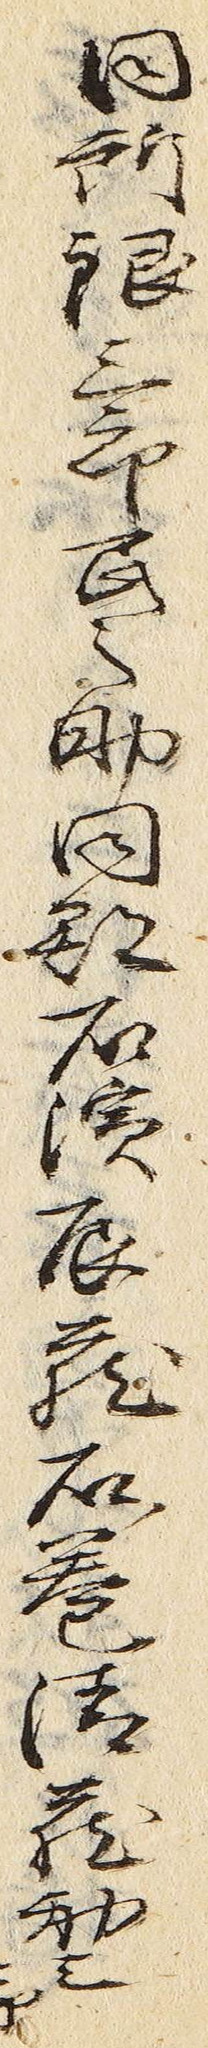同所銀三郎民之助同郡石浜辰蔵石巻清蔵初三郎
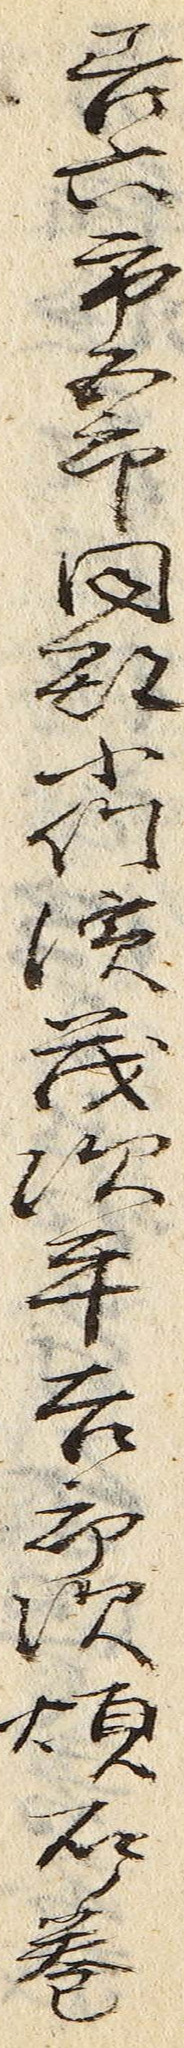善六市五郎同郡小竹浜茂次平吉郎次煩石ノ巻
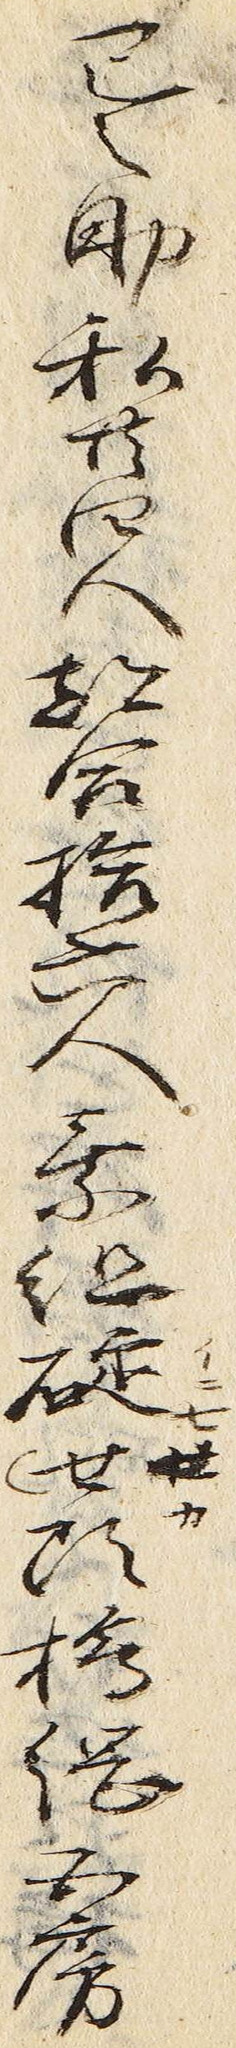見巳之助私共四人都合拾六人乗組碇せ頭樽綱五房
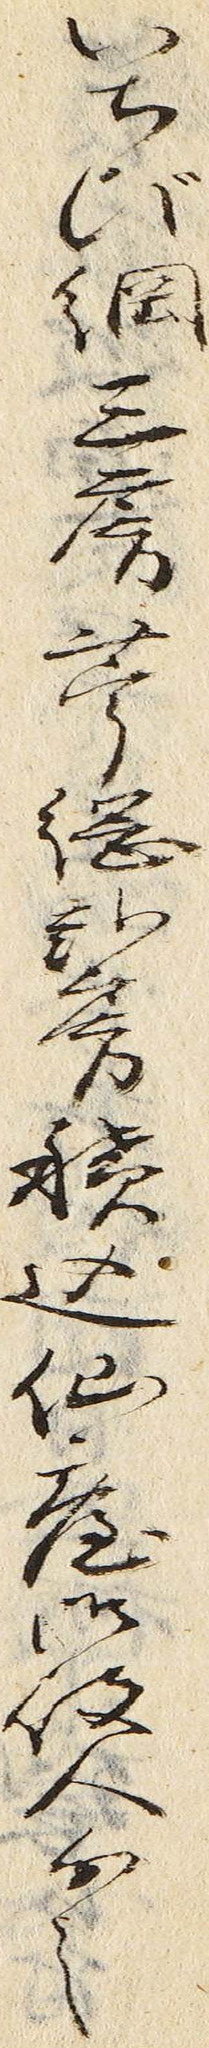いちび綱三房苧綱弐房積込仙台御役人ゟ之
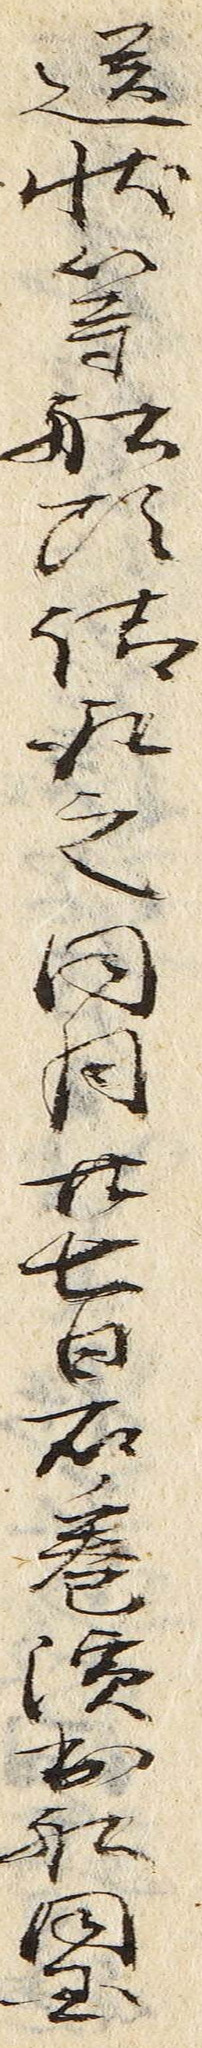送状等船頭請取之同月廿七日石ノ巻浜出船同国
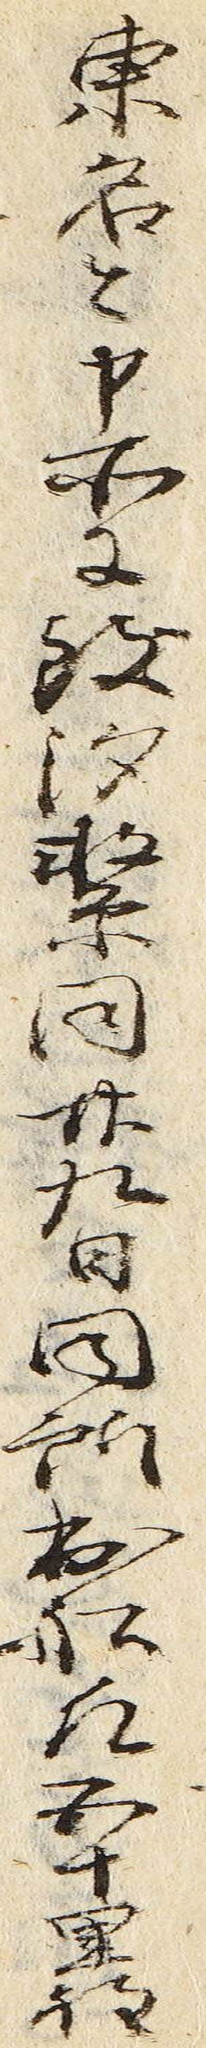東名と申所に致汐繋同廿九日同所出船凡五十里程
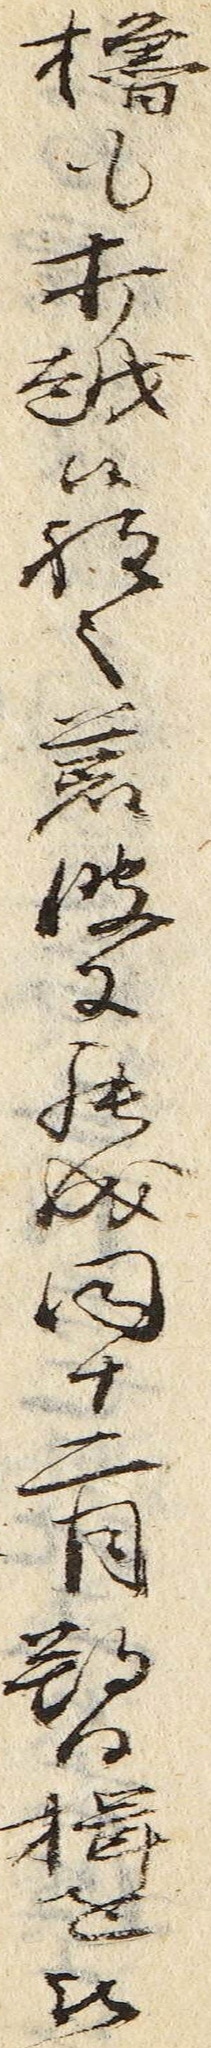櫓も打越候程之荒波に罷成同十二月朔日楫を被
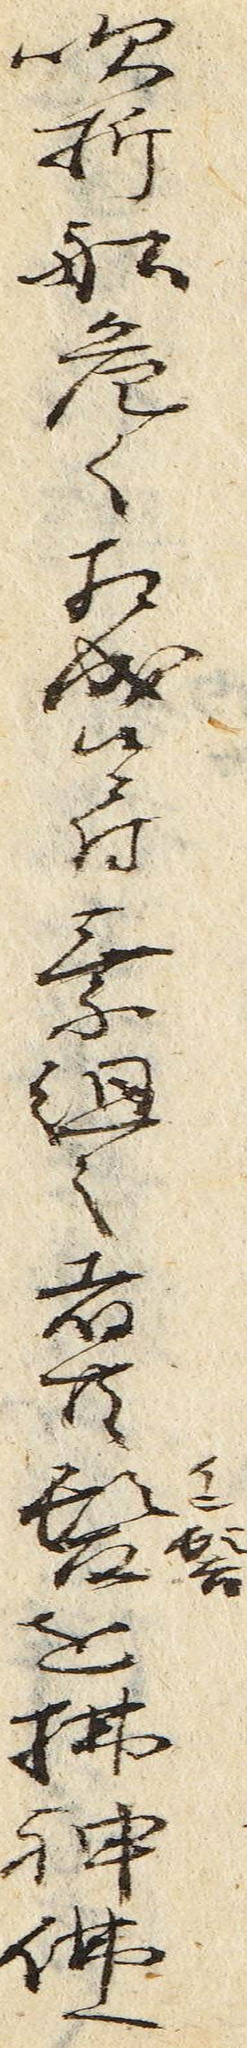吹折船危く相成候に付乗組之者共髪を払神仏へ
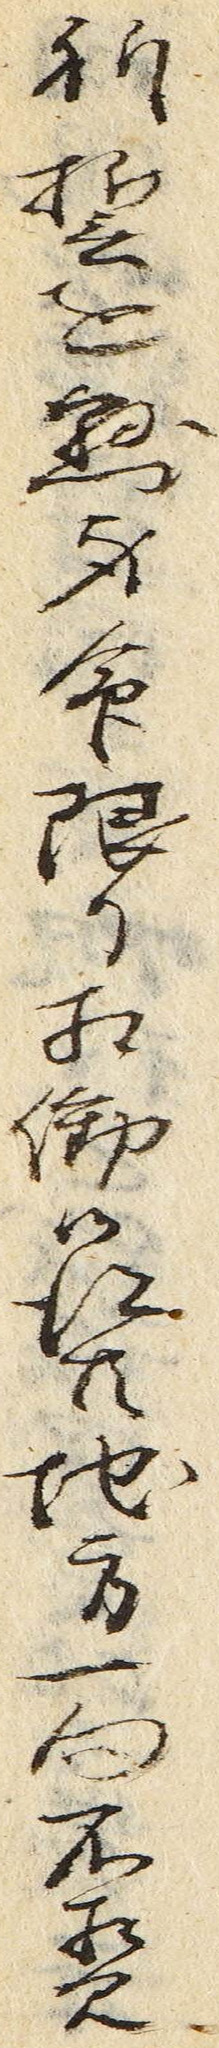祈誓を懸身命限り相働候得共地方一向不相見
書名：漂民後記
